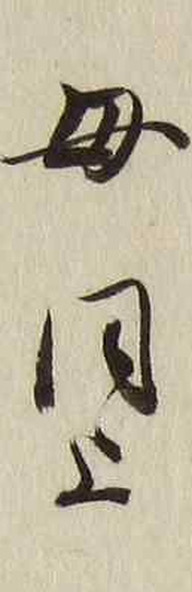母同上
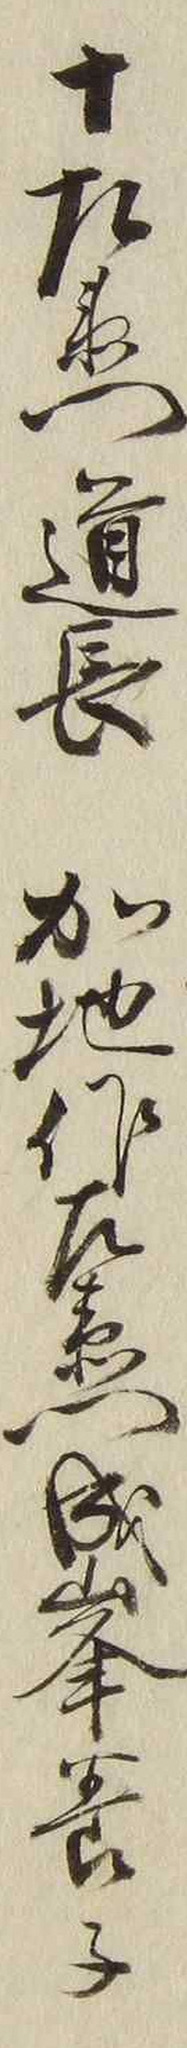十左衛門道長加地作左衛門成峯養子

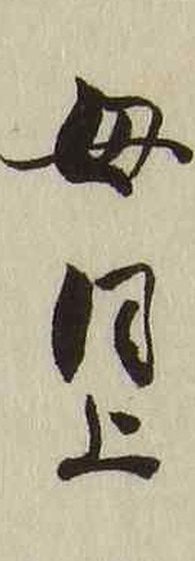母同上
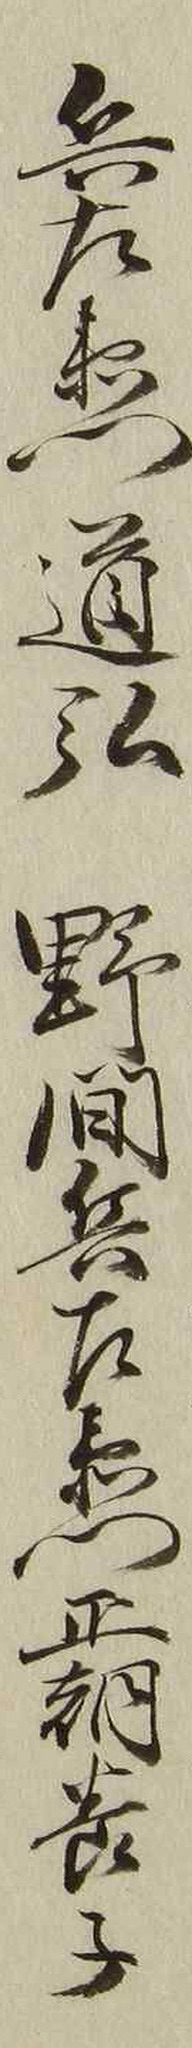兵左衛門道弘野間兵左衛門正朝養子
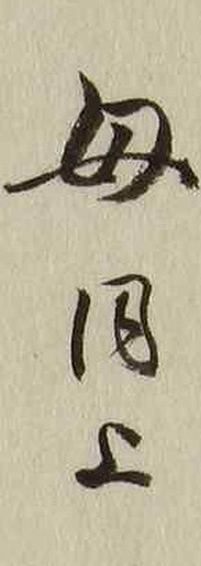母同上
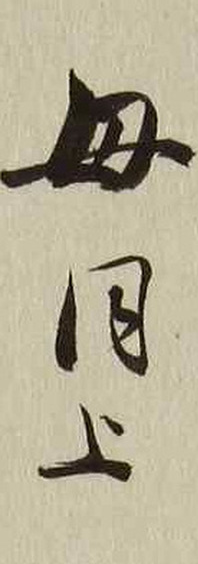母同上
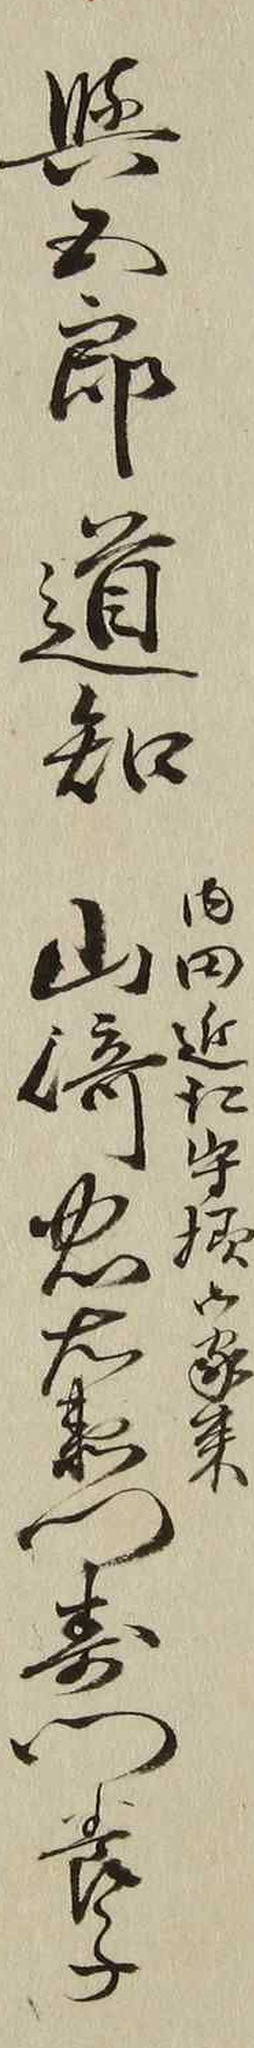与五郎道知山崎忠右衛門寿門養子
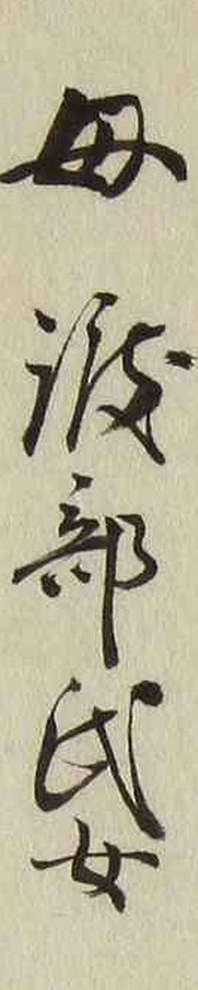母渡部氏女
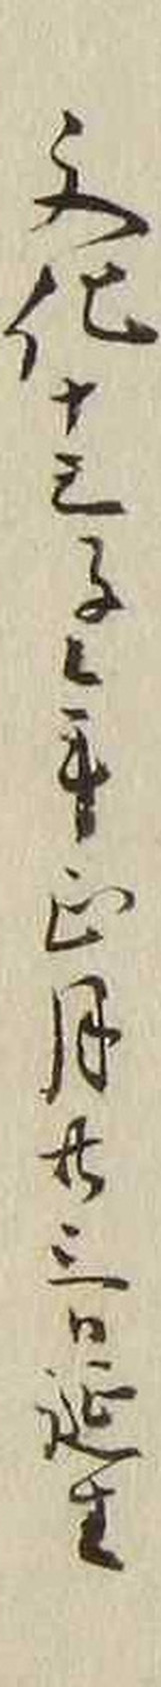女文化十三子年正月廿三日延生

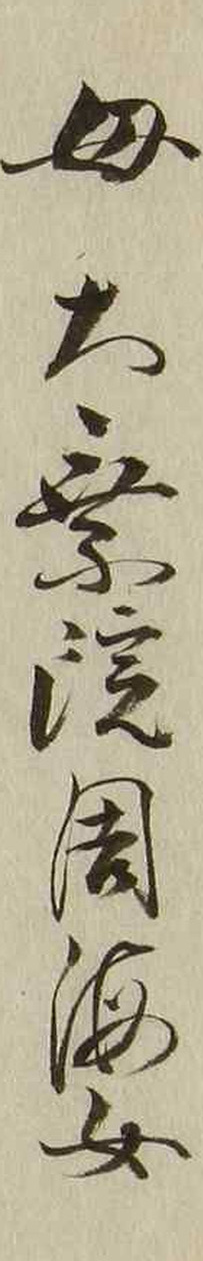母大乗院周海女
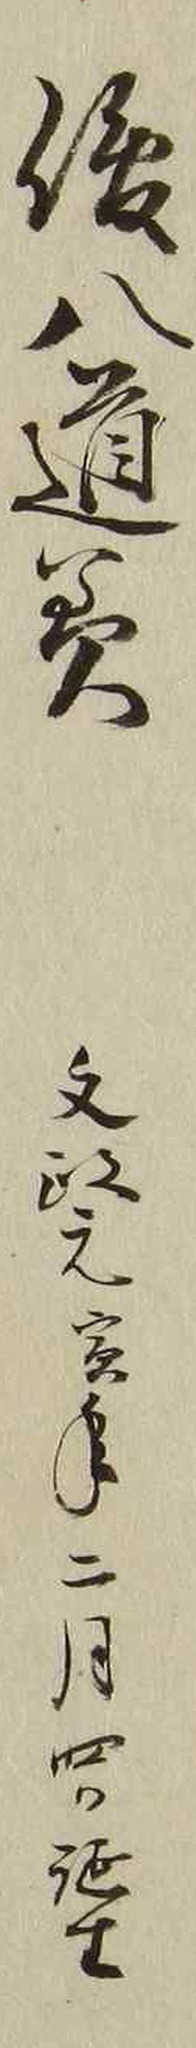俊八道美文政元寅年二月四日誕生
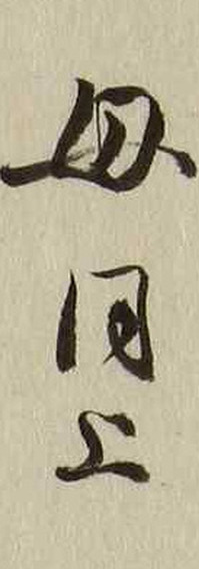母同上
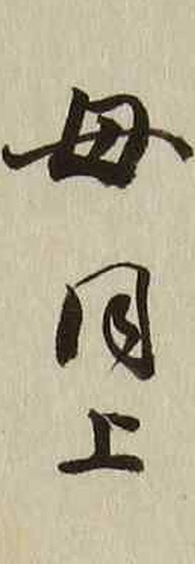母同上
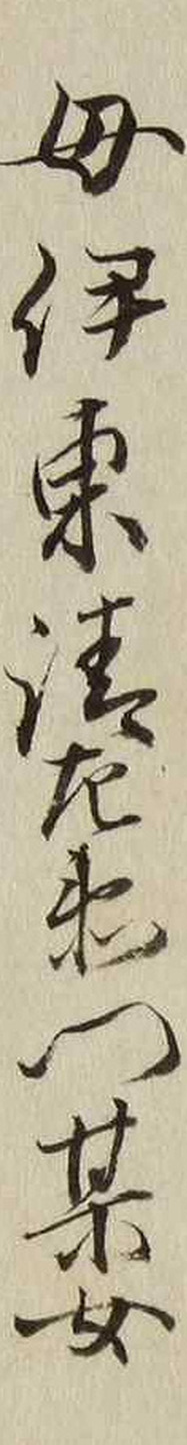母伊東清左衛門某女
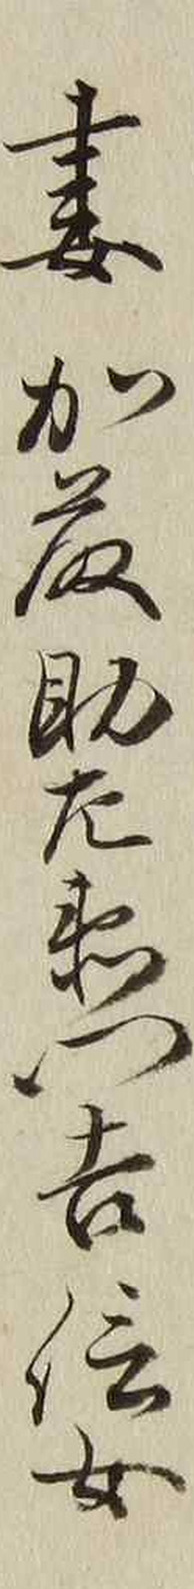妻加藤助左衛門吉信女
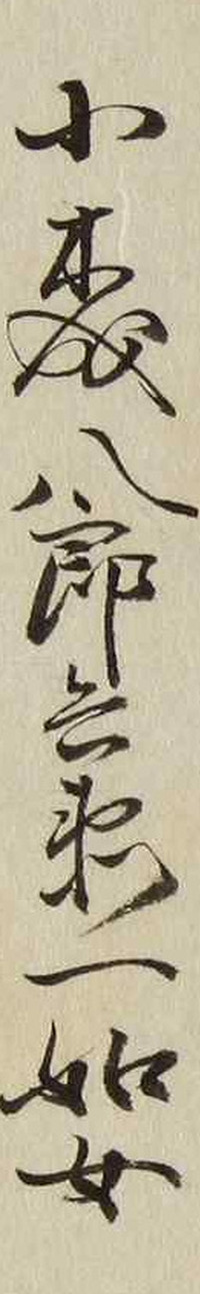小森八郎兵衛一如女
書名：諸士系譜　巻之157　ね之部1
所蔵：会津若松市立会津図書館
